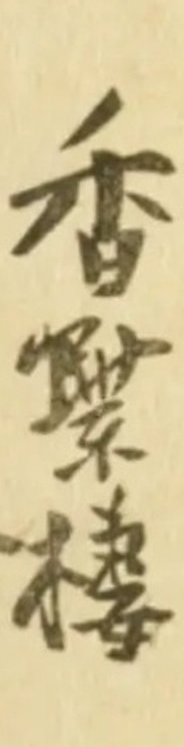香蝶棲
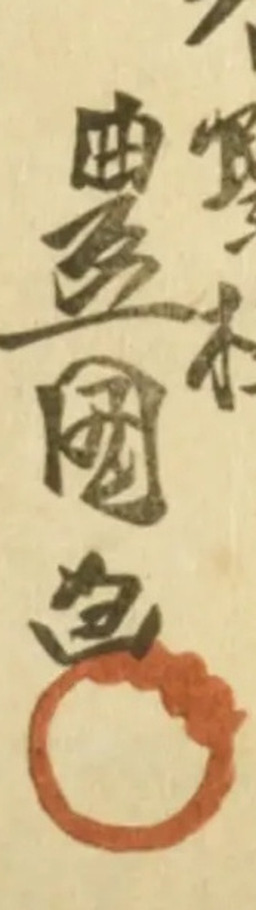豊国画
